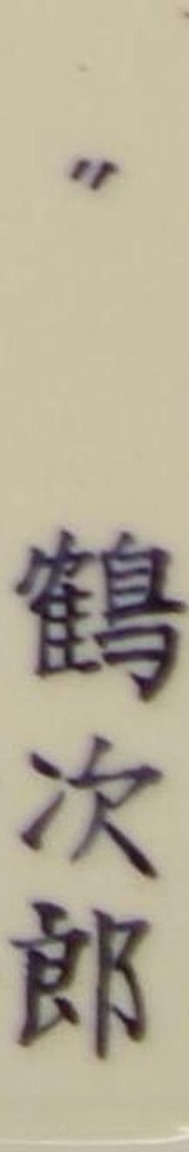鶴次郎
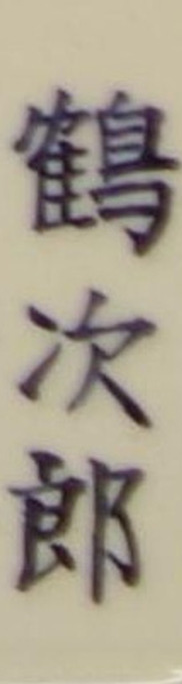鶴次郎
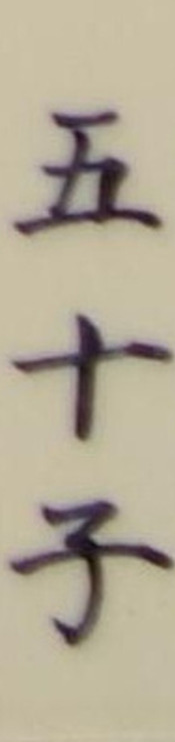五十子
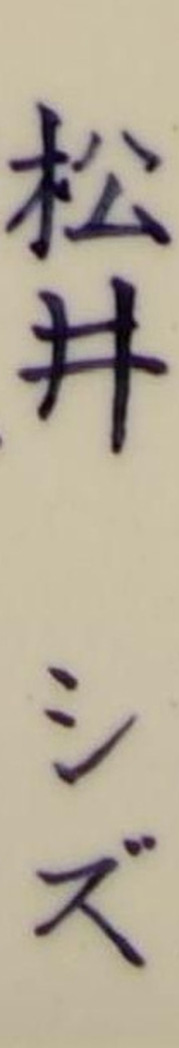松井シズ
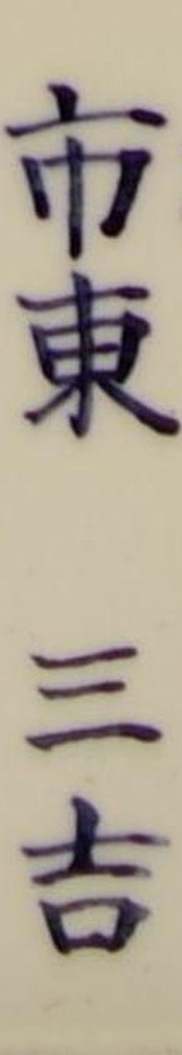市東三吉
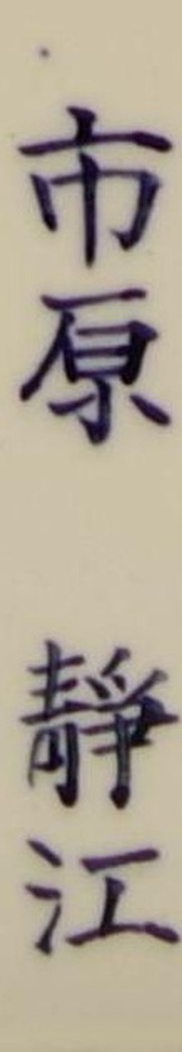市原静江
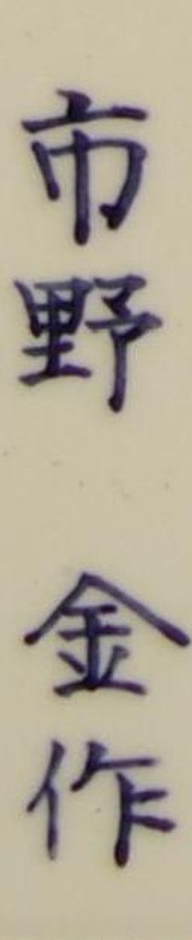市野金作
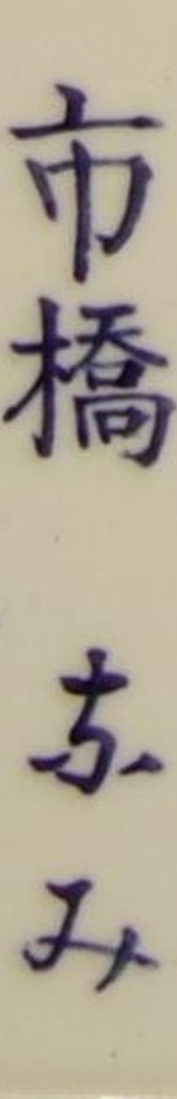市橋なみ
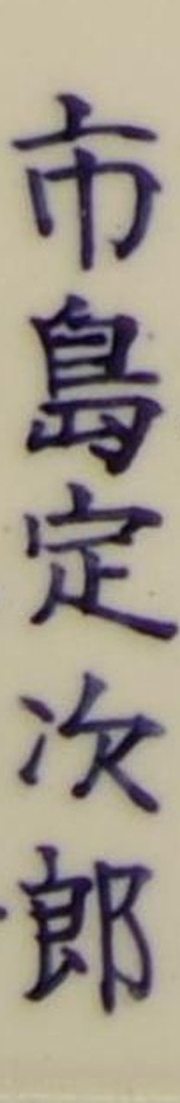市島定次郎
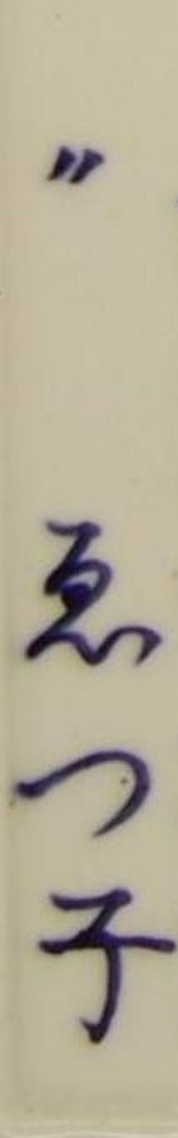ゑつ子
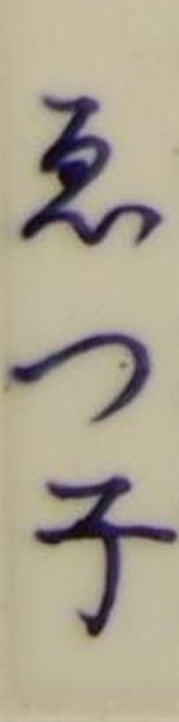ゑつ子

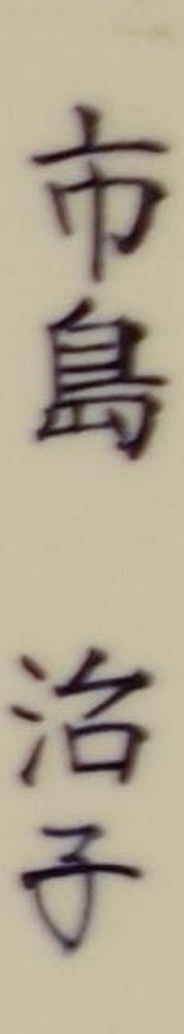市島治子
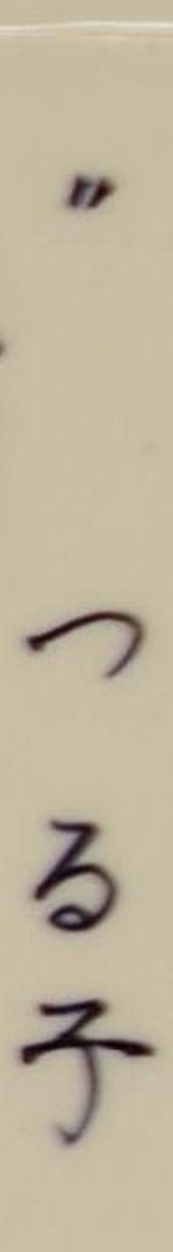つる子
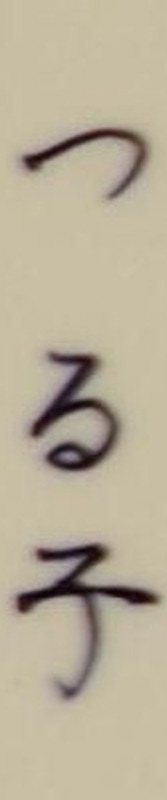つる子
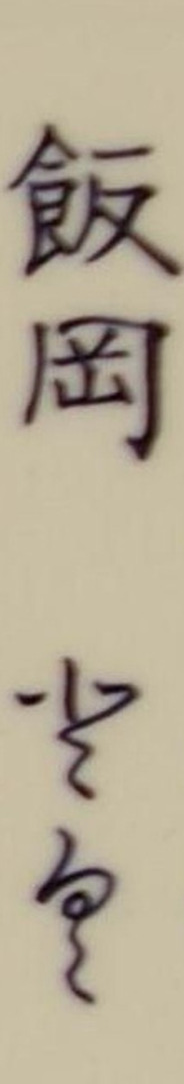飯岡とく
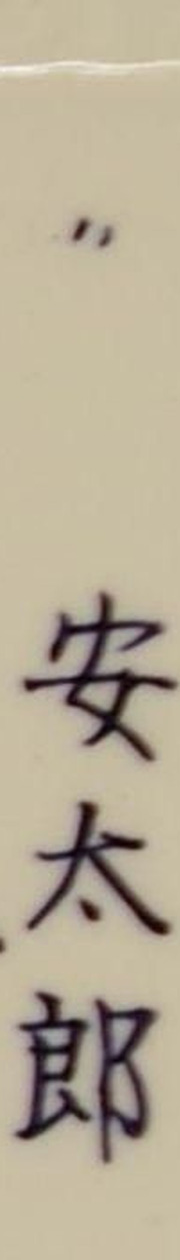安太郎
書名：A~D
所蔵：koyasan kongobuji
